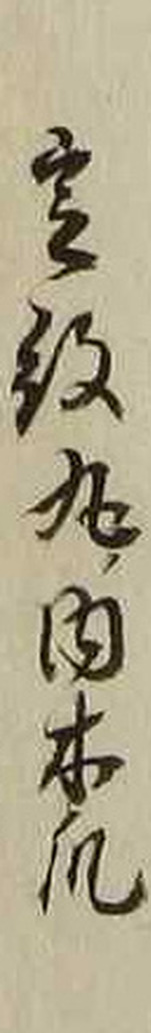姓源定紋丸内木瓜
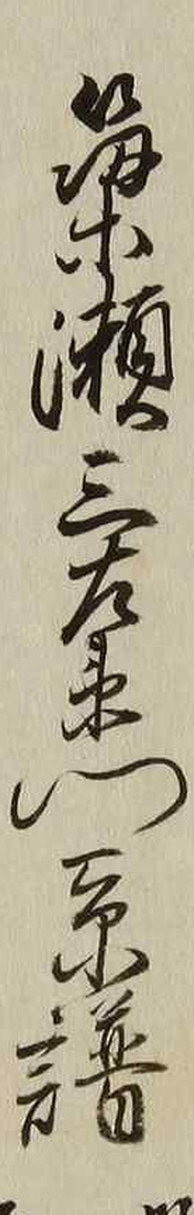柳瀬三左衛門正真
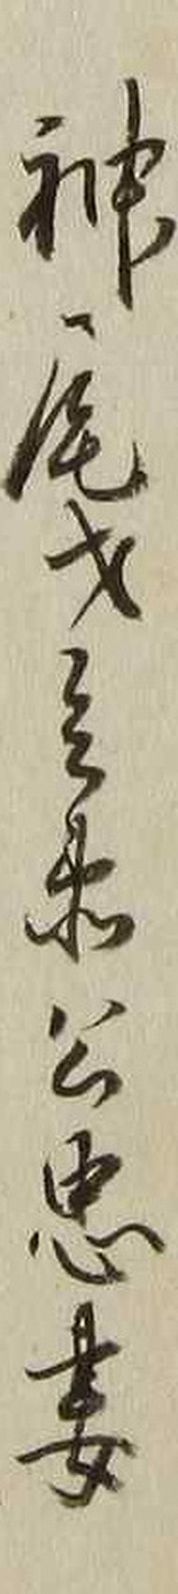女神尾才兵衛公忠妻
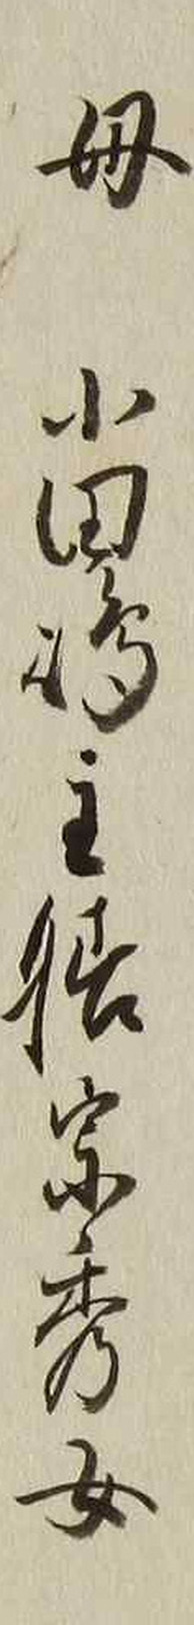母母小田嶋主膳宗秀女
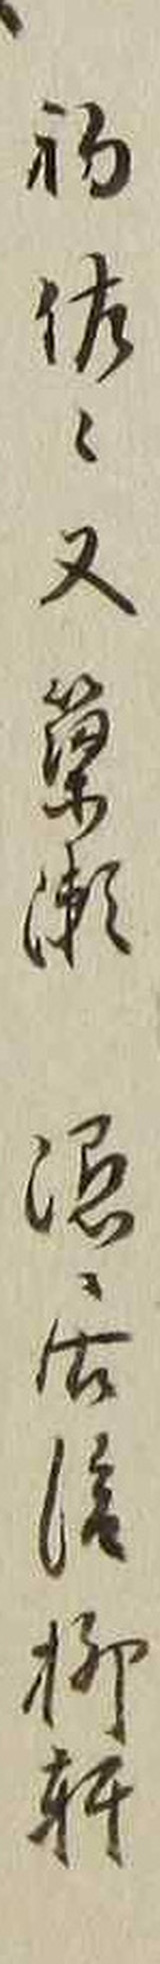初佐々又簗瀬隠居後柳軒
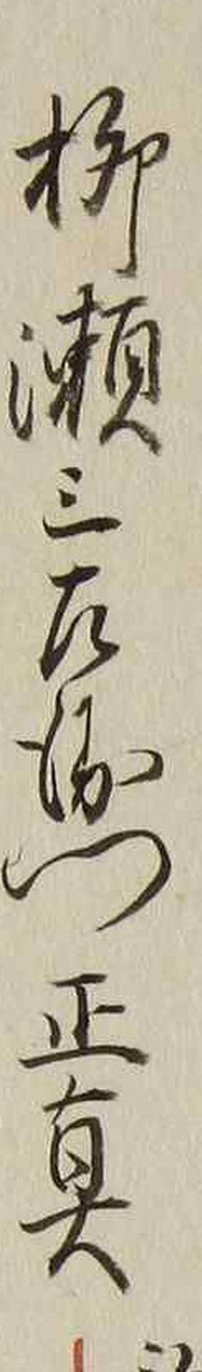柳瀬三左衛門正真
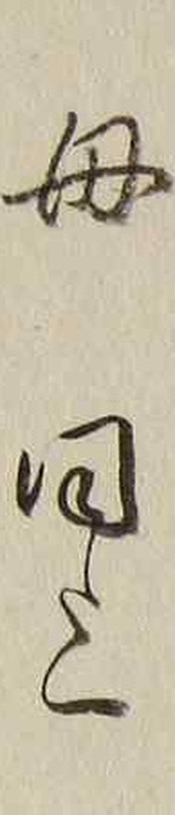母同上

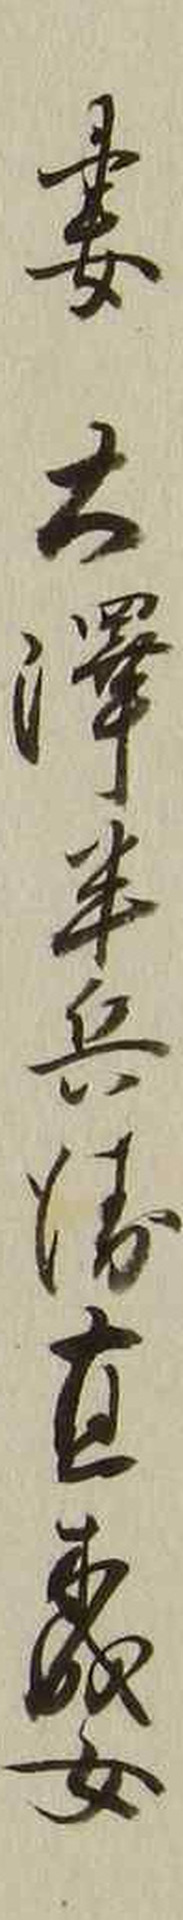妻大沢半兵衛直森女
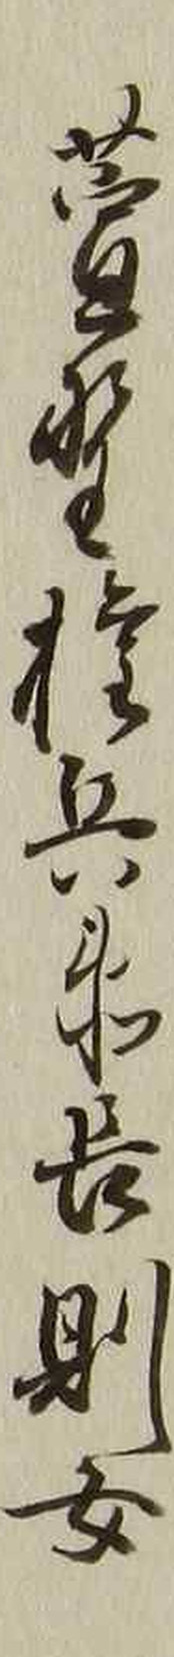萱野権兵衛長則女
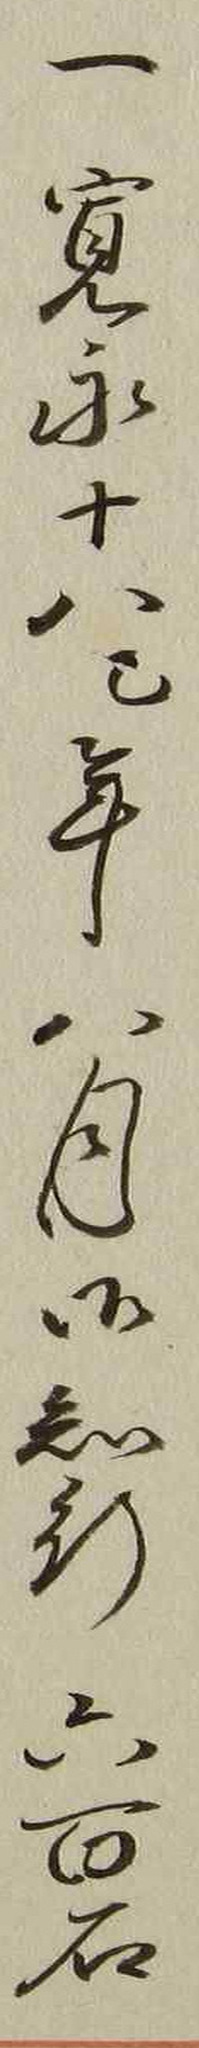一寛永十八巳年八月御知行六百石
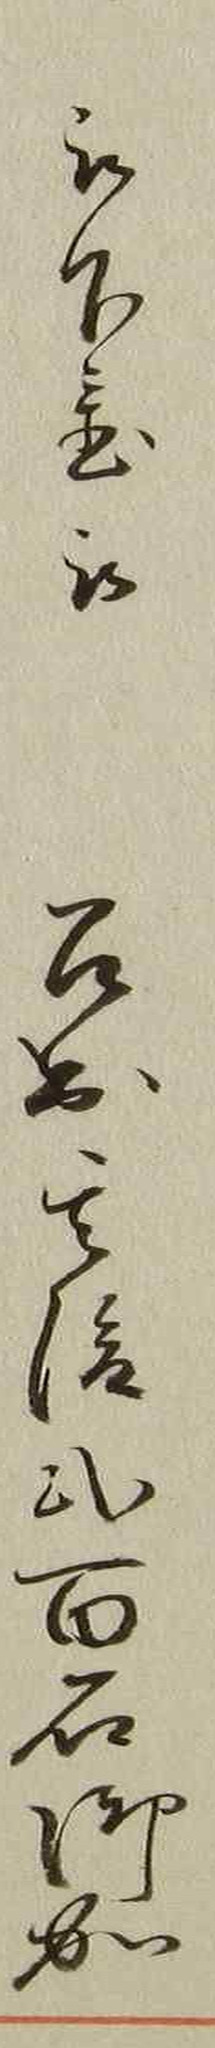被下置被召出其後弐百石御加
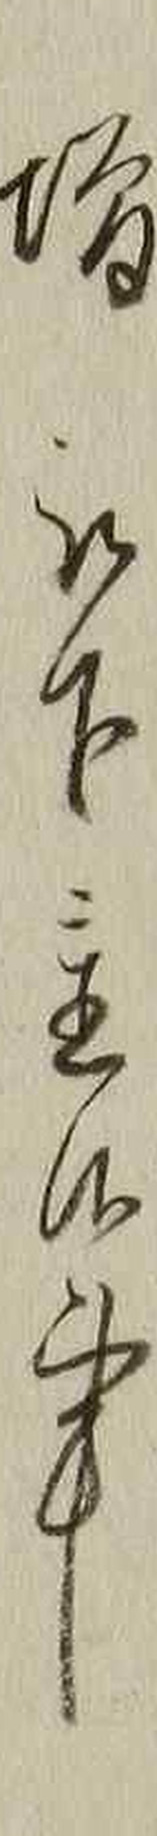増被下置候事
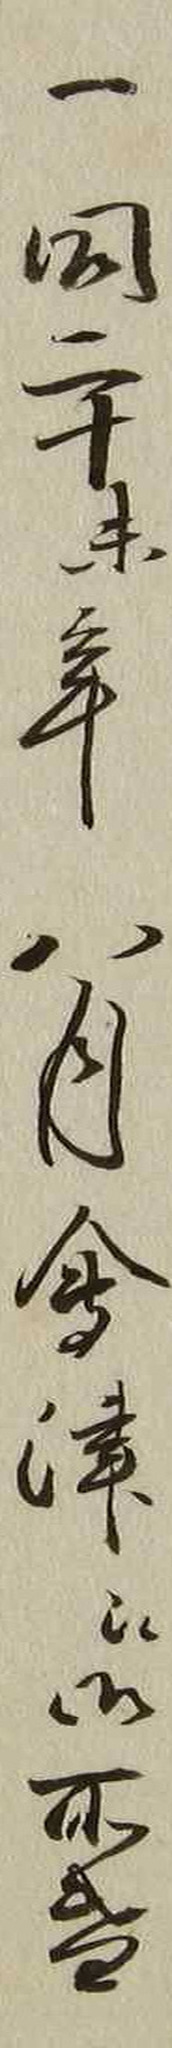一同二十未年八月会津江御所替
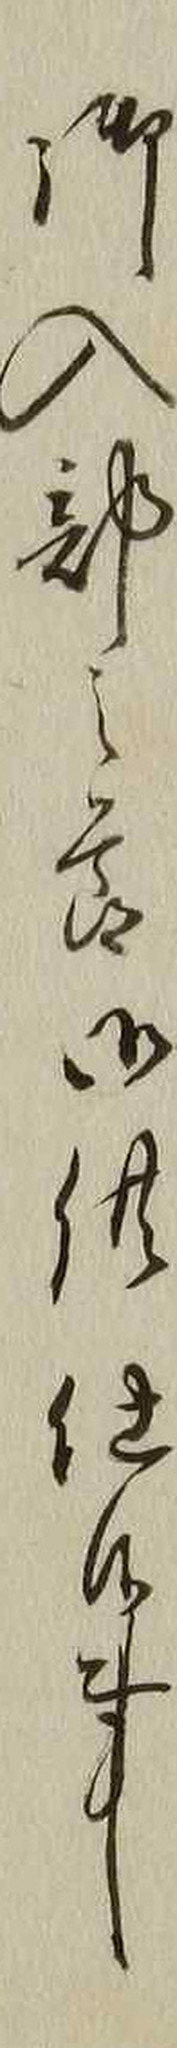御入部之節御供仕候事
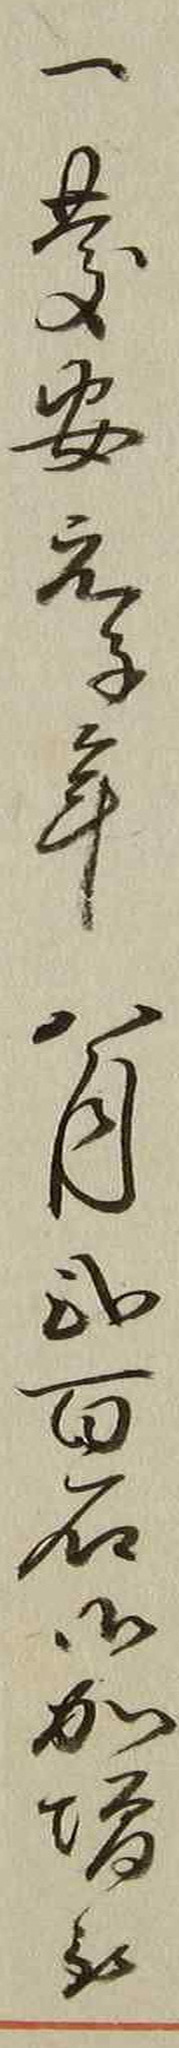一慶安元子年八月弐百石御加増被
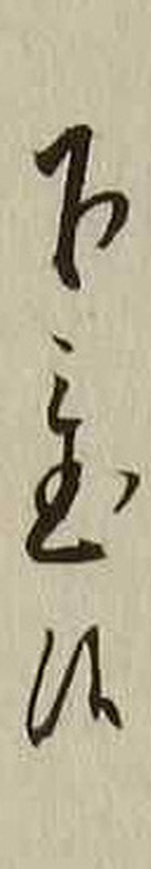下置候
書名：諸士系譜　巻之204　や之部1
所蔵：会津若松市立会津図書館
